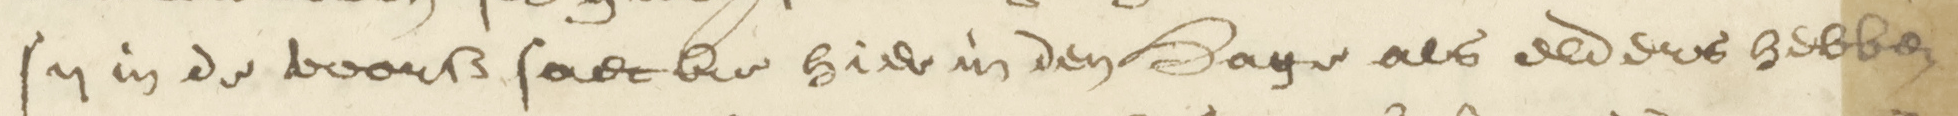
sy in de voors saecke hier in den Hage als elders hebben
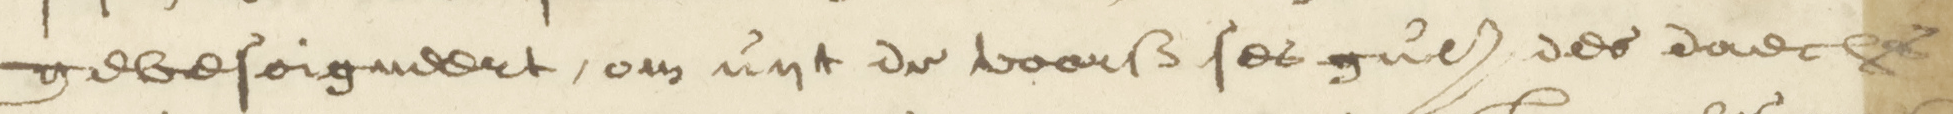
gebesoigneert, om uyt de voors ses gul des daechs
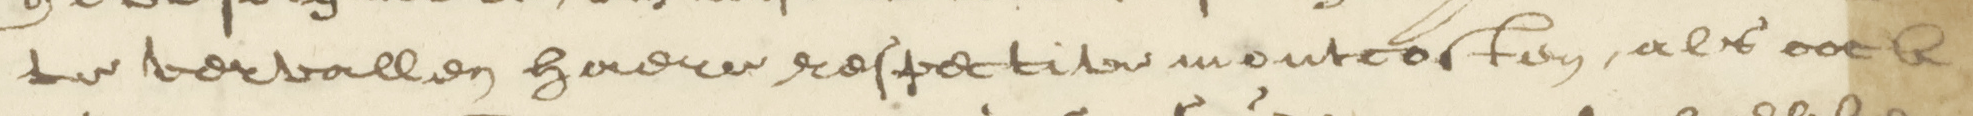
te vervallen haere respective montcosten, als oock
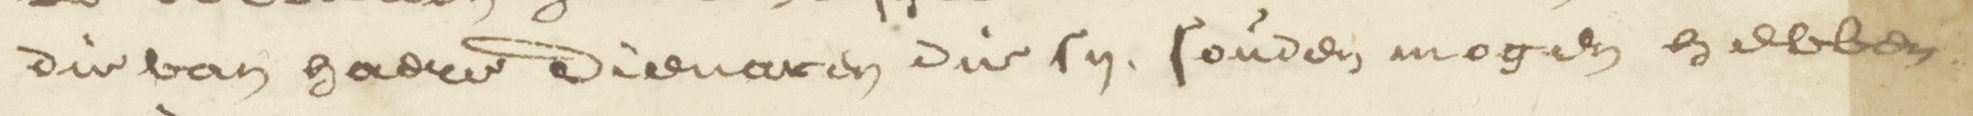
die van haere Dienaren die sy souden mogen hebben
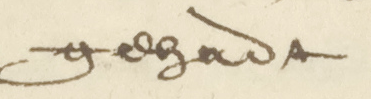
gehadt.
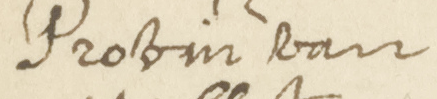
Provin van
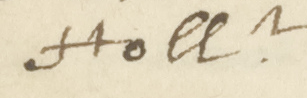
Hollt.
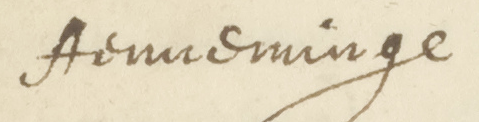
Aenneminge
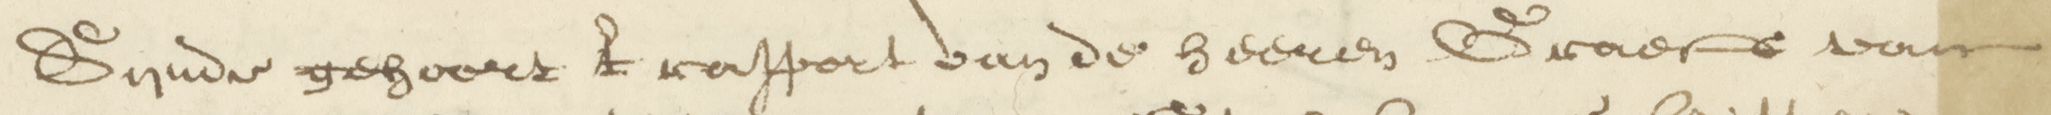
Synde gehoort t rapport van de heeren Graeff van
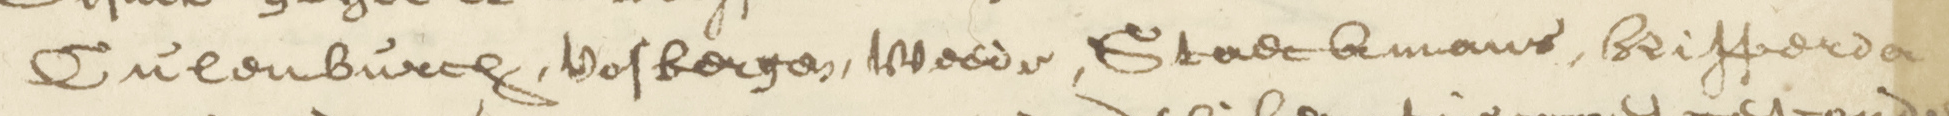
Culenburch, Vosbergen, Weede, Staeckmans, Ripperda
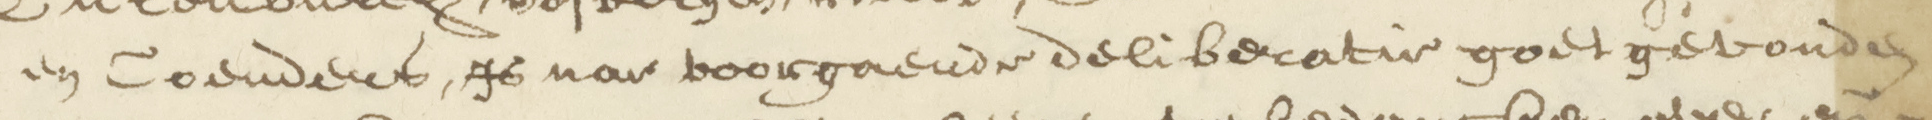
en Coenders. Is nae voorgaende deliberatie goetgevonden
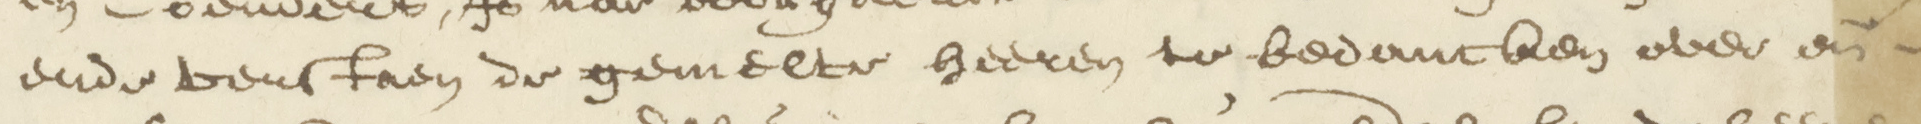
ende verstaen de gemelte heeren te bedancken over en
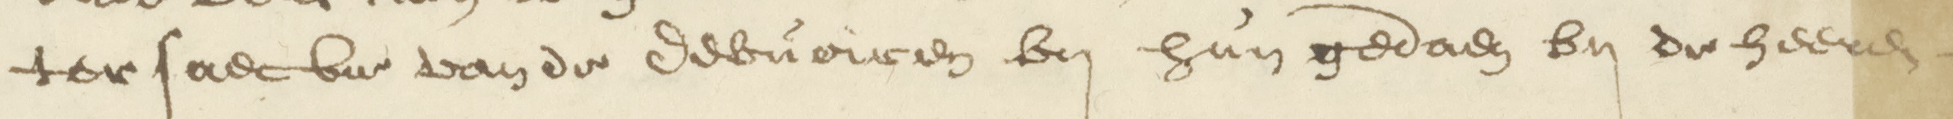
ter saecke van de Debuoiren by hun gedaen by de heeren
